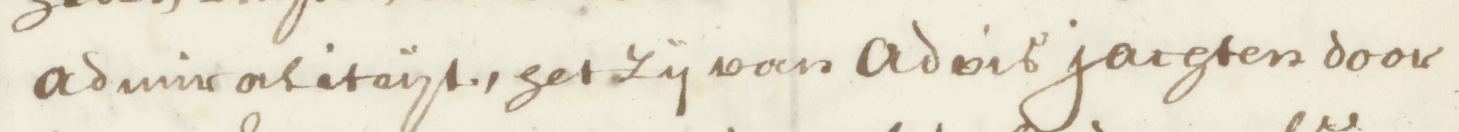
admiraliteijt, het zij van Advis Jachten door
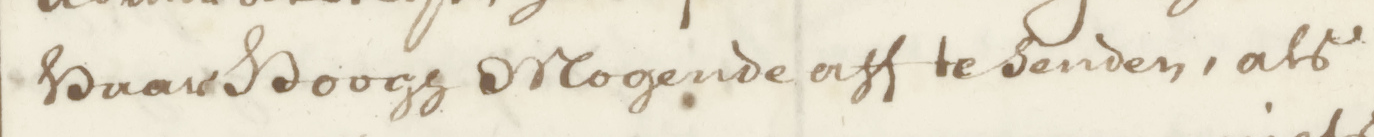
Haare Hoogh Mogende aff te senden, als
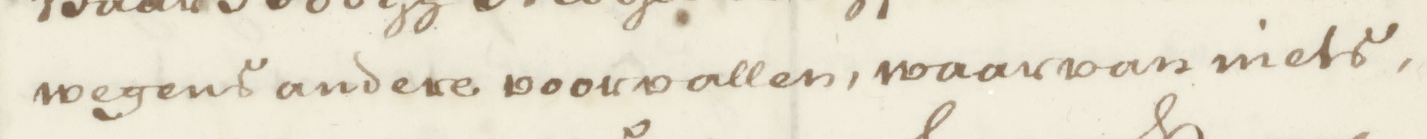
wegens andere voorvallen, waarvan niets
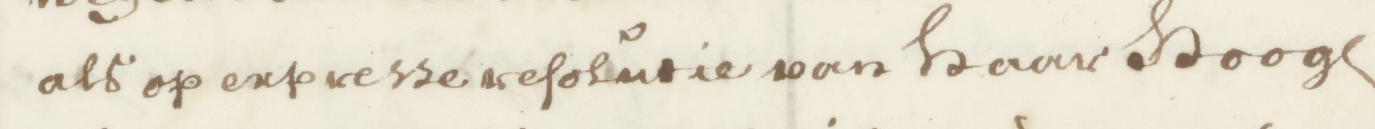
als op expresse resolutie van Haar Hoogh
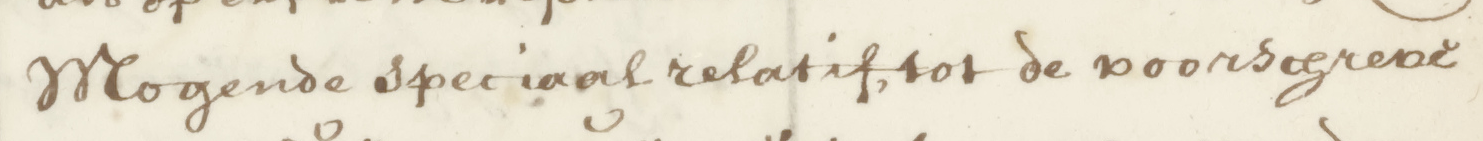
Mogende speciaal relatif, tot de voorschreve
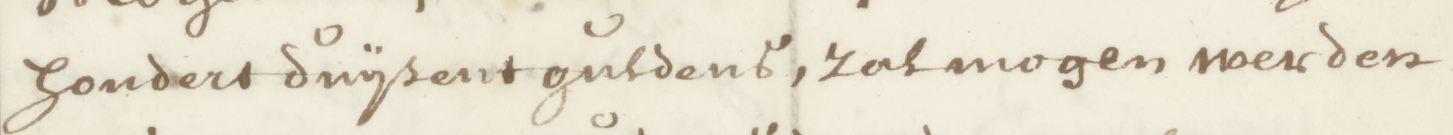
hondert duijsent guldens, zal mogen werden
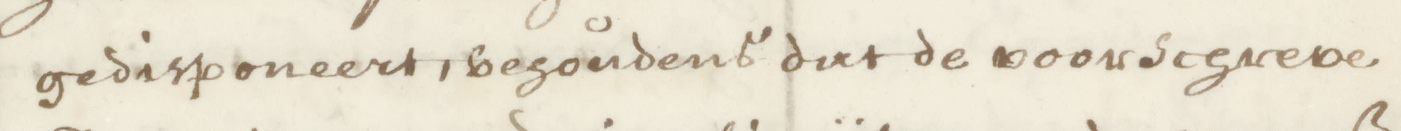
gedisponeert, behoudens dat de voorschreve
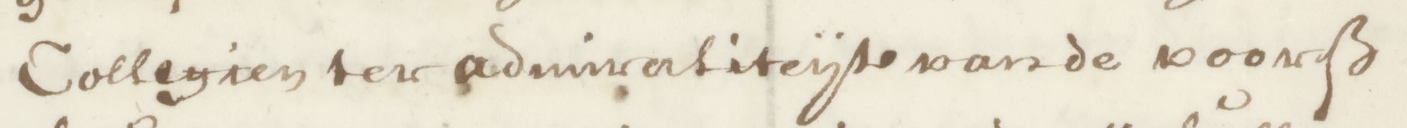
Collegien ter admiraliteijt vande voors
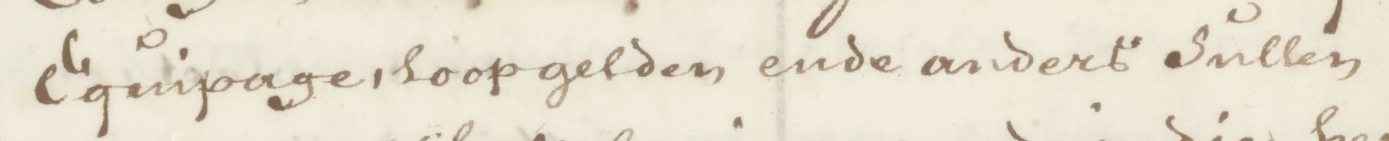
Equipage, loopgelden ende anders sullen
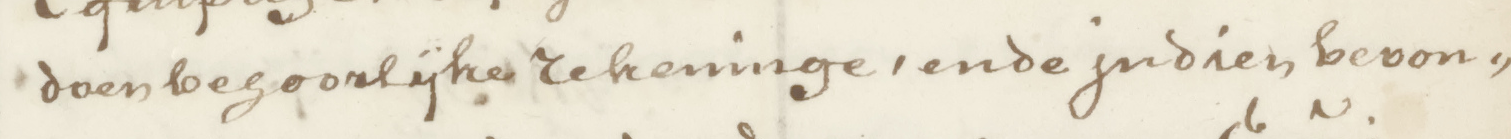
doen behoorlijke rekeninge, ende Indien bevon„
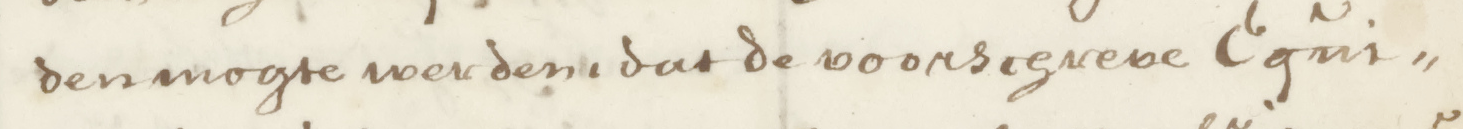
den mogte werden, dat de voorschreve Equi„
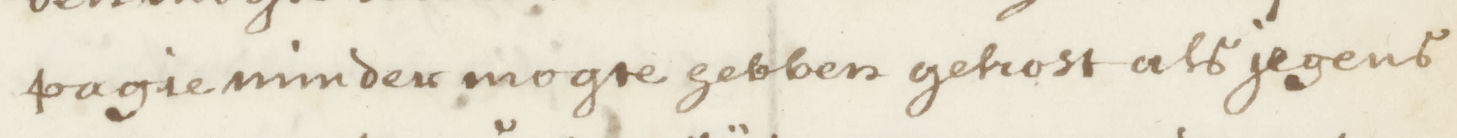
pagie minder mogte hebben gekost als jegens
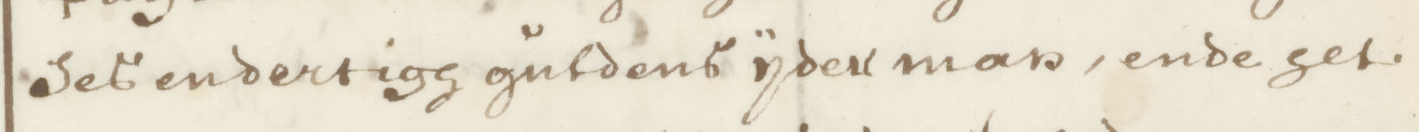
ses endertigh guldens ijder man, ende het
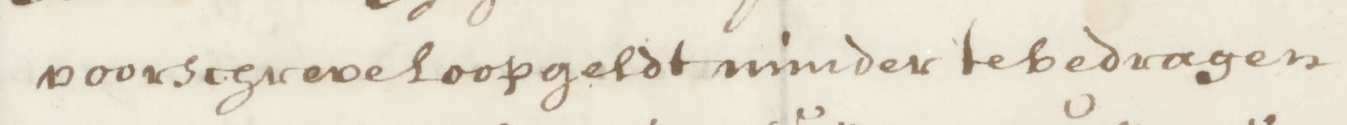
voorschreve loopgeldt minder te bedragen
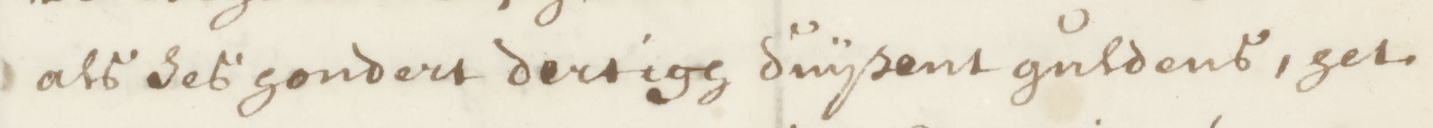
als Ses hondert dertigh duijsent guldens, het
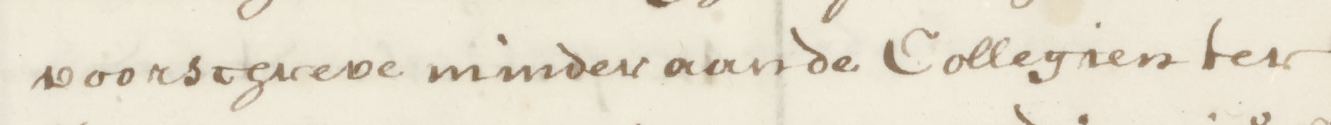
voorschreve minder aan de Collegien ter
